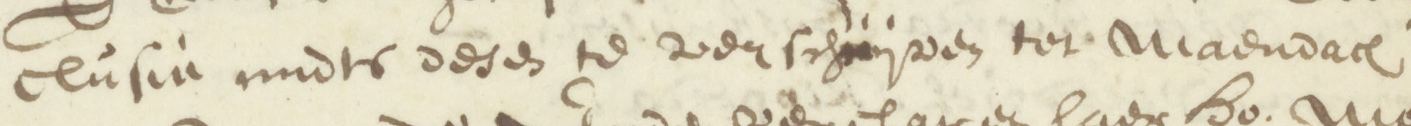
clusie midts desen te verschuijven tot maendach
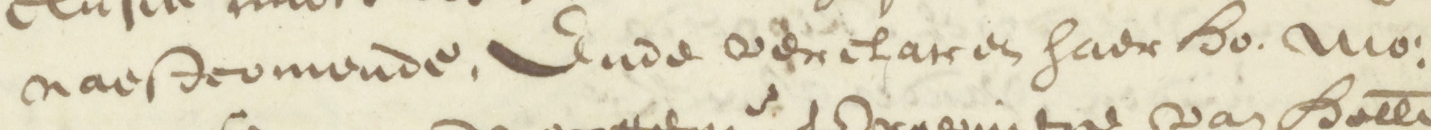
naestcomende, Ende verclaren haer Ho:Mo:
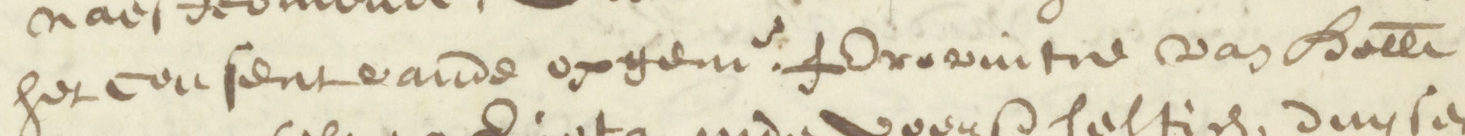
het consent vande opgeme. Provintie van Hollt
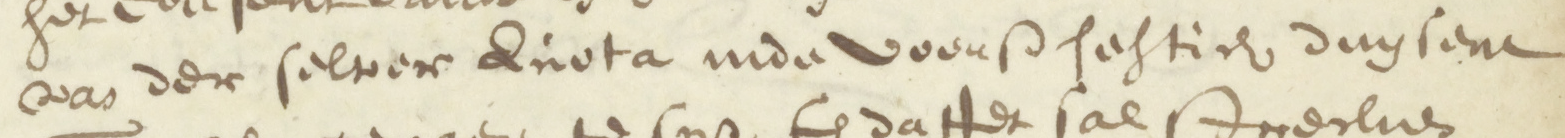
van der selver Quota inde voors sestich duysent
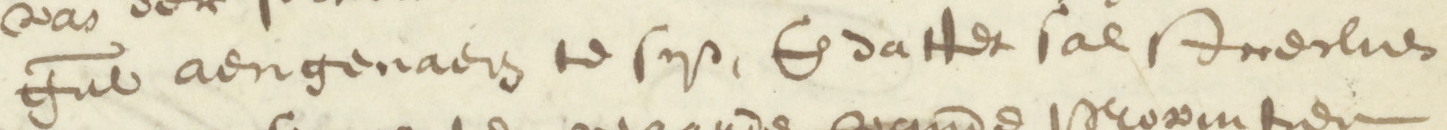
gul aengenaem te syn, & dattet sal strecken
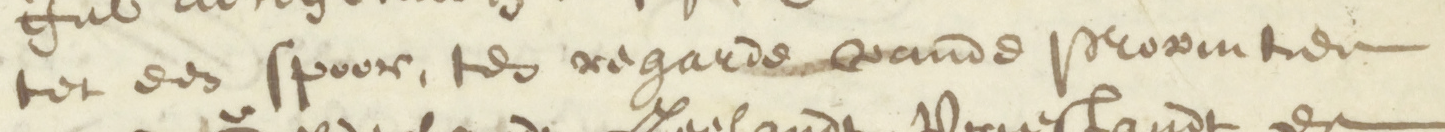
tot een spoor, ten regarde vande provintien
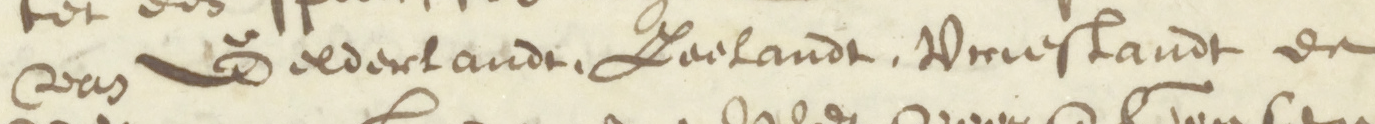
van Gelderlandt, Zeelandt, Vrieslandt en
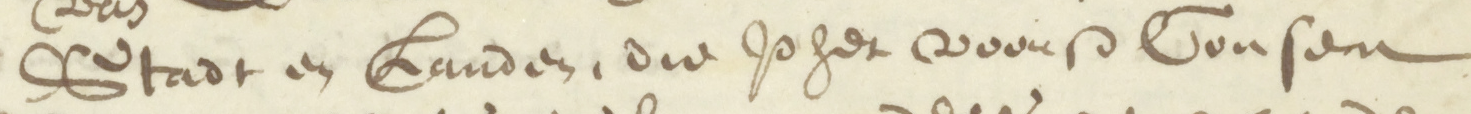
Stadt en Landen, die In het voors Consent
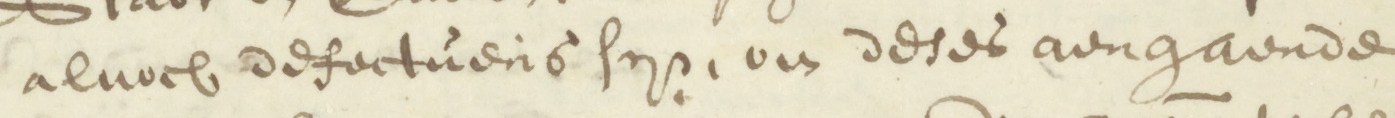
alnoch defectueus syn, om deses aengaende
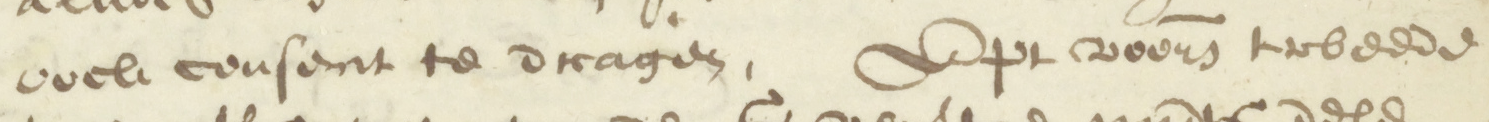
oock consent te dragen. Opt voors tweede
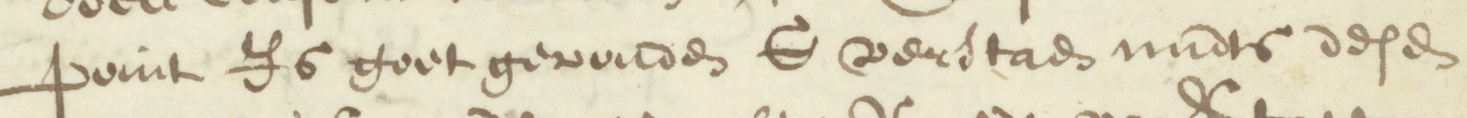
point Is goet gevonden & verstaen midts desen
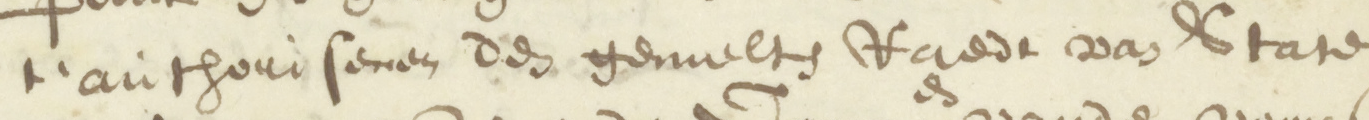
t'authoriseren den gemelten Raedt van State
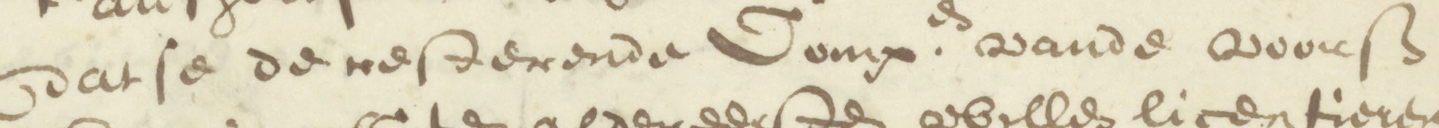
datse de resterende Compen. vande voors
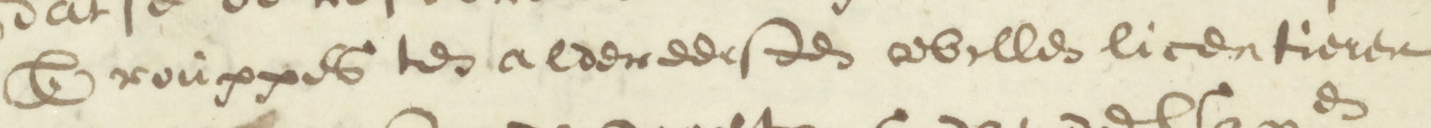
Trouppes ten aldereersten willen licentieren
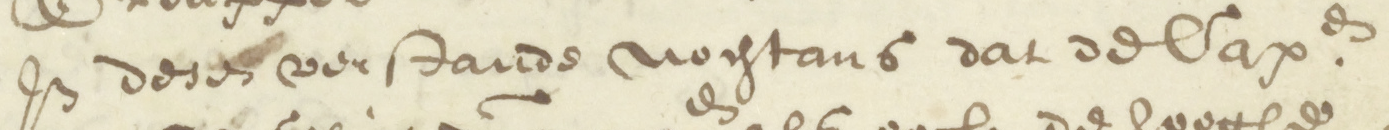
In desen verstande nochtans dat de Capen.
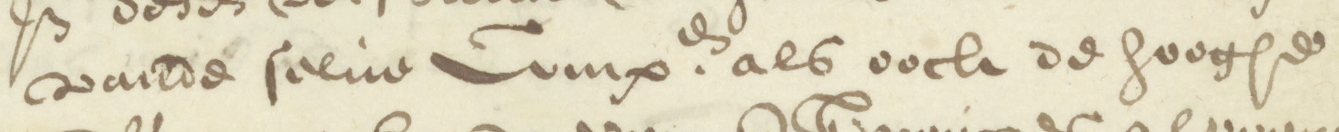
vande selue Compen. als oock de hooghe
